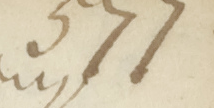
577
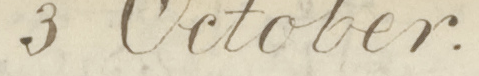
3 October.
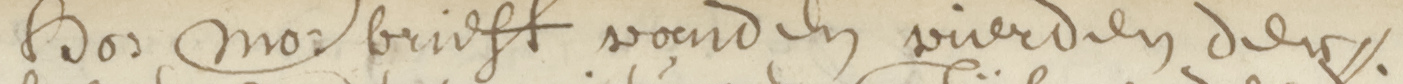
Ho:Mo: brieff vanden vierden der,,
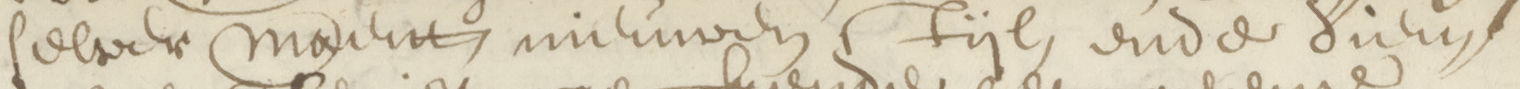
selver maent, nieuwen stijl, ende dien„
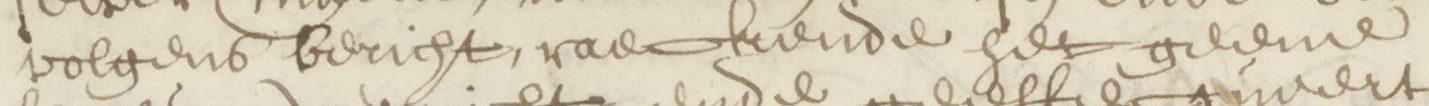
volgens bericht, raeckende het geene
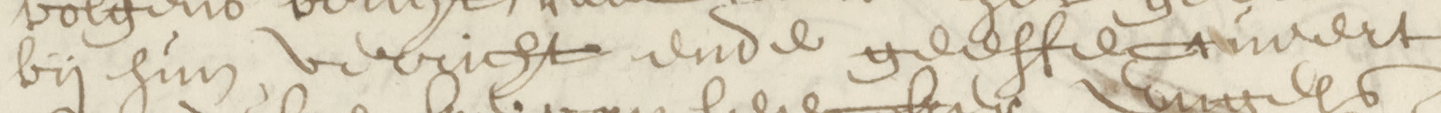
bij hun verricht ende geeffectueert
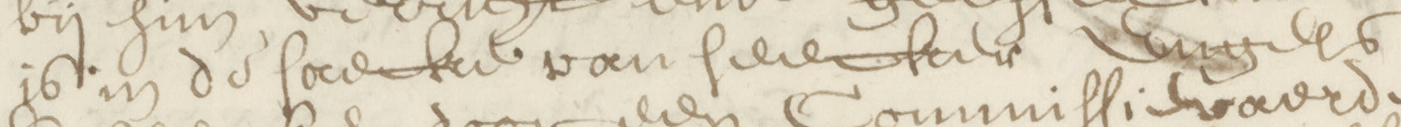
is in de saecke van seecker Engels
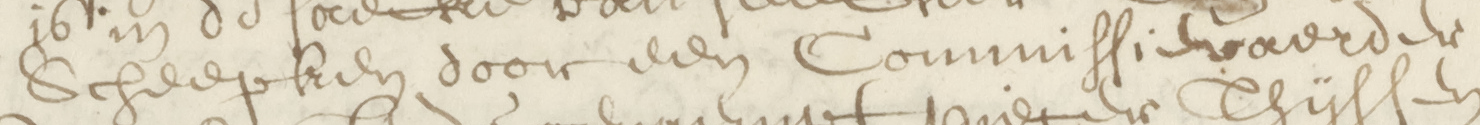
Scheepken door een Commissievaerder
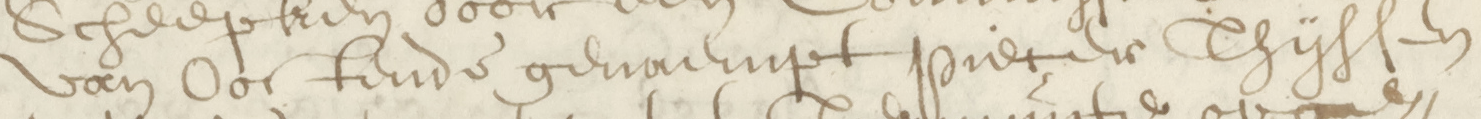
van Oostende genaempt Pieter Thijssen
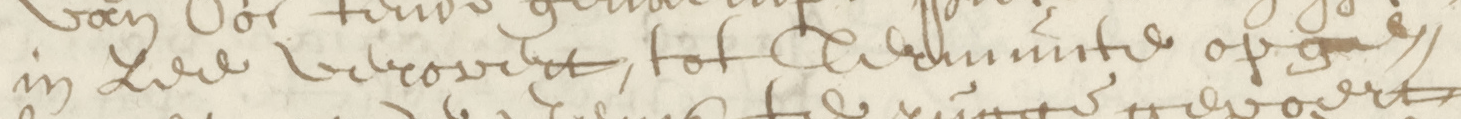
in Zee verovert, tot Termunte opge„
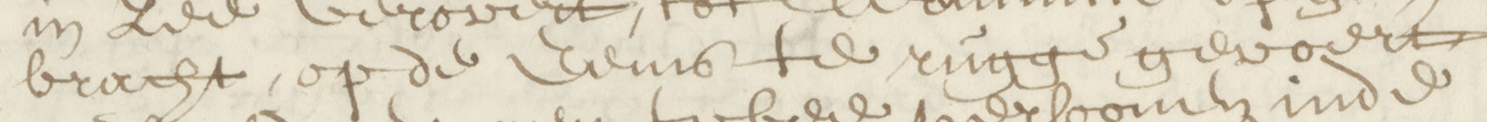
bracht, op de Eems te rugge gevoert
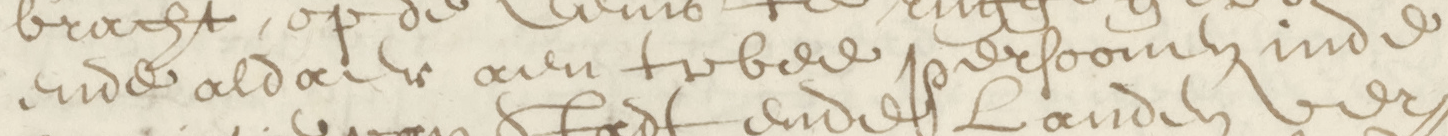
ende aldaer aen twee persoonen inde
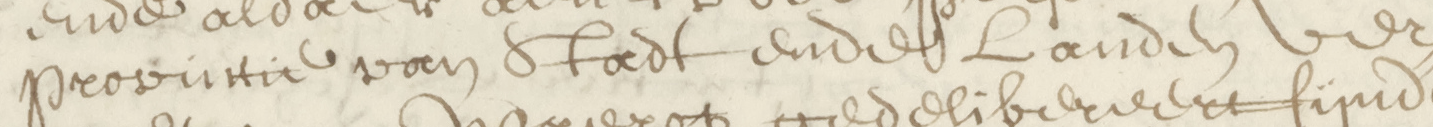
provintie van Stadt ende Landen ver
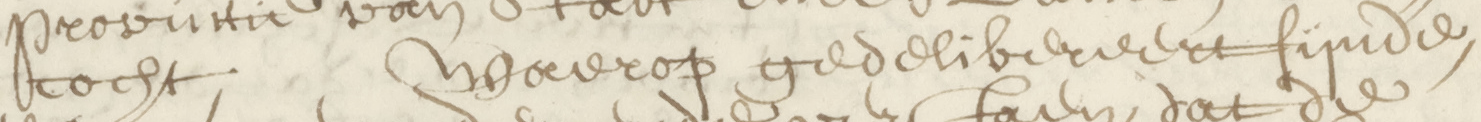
cocht. Waerop gedelibereert sijnde,
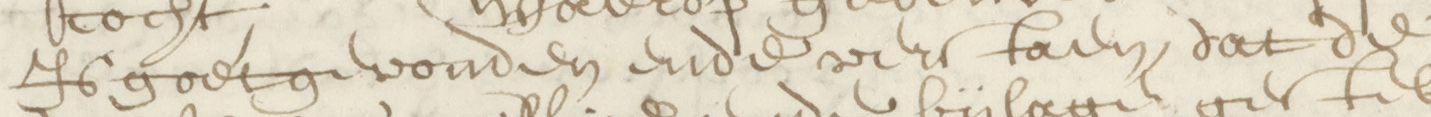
is goetgevonden ende verstaen, dat de
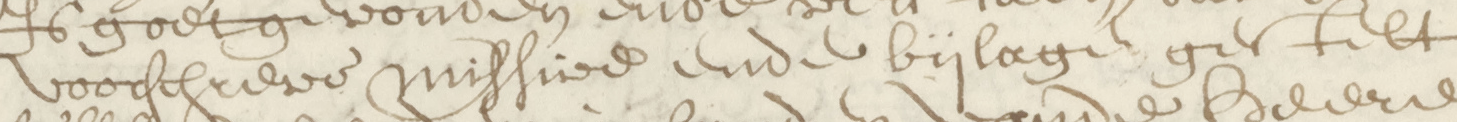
voorschreve missive ende bijlage, gestelt
